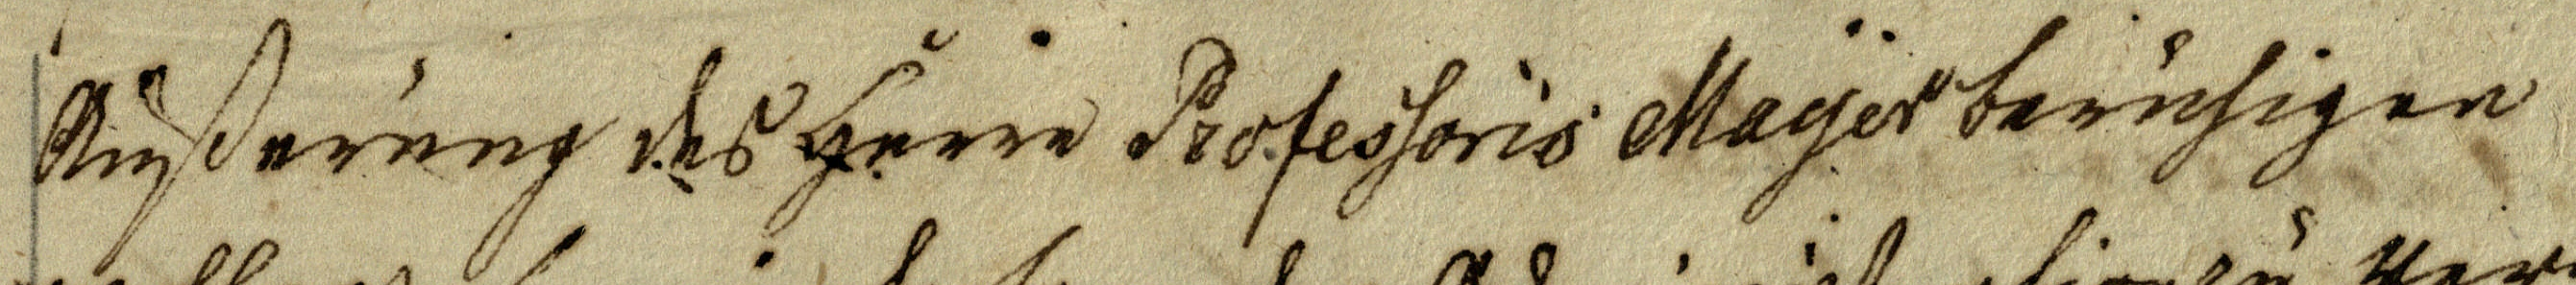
Äußerung des Herrn Professoris Maÿer beruhigen
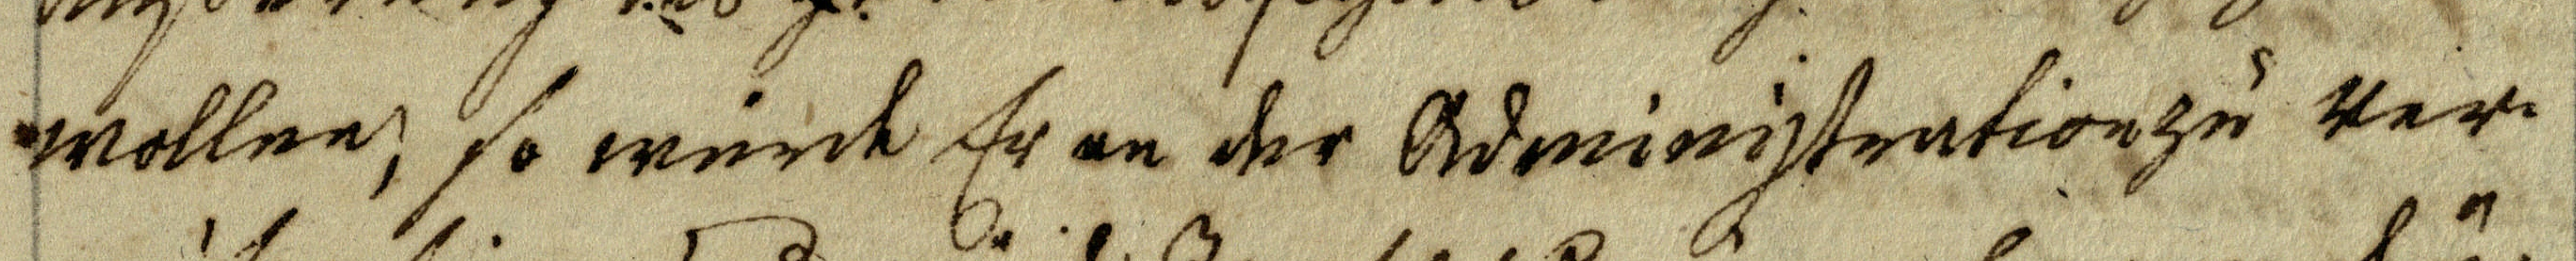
wollen, so würde Er an der Administration zu ver¬
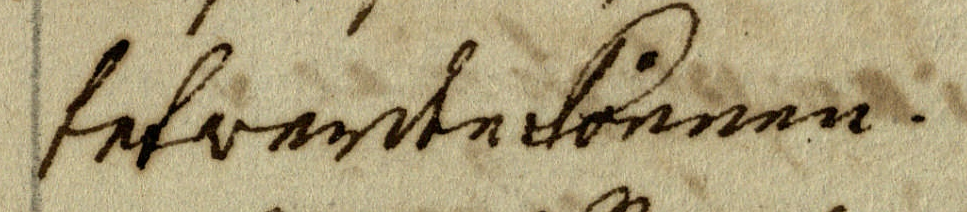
weisen sein, und würde Ihm solches nunmehro angedeu¬
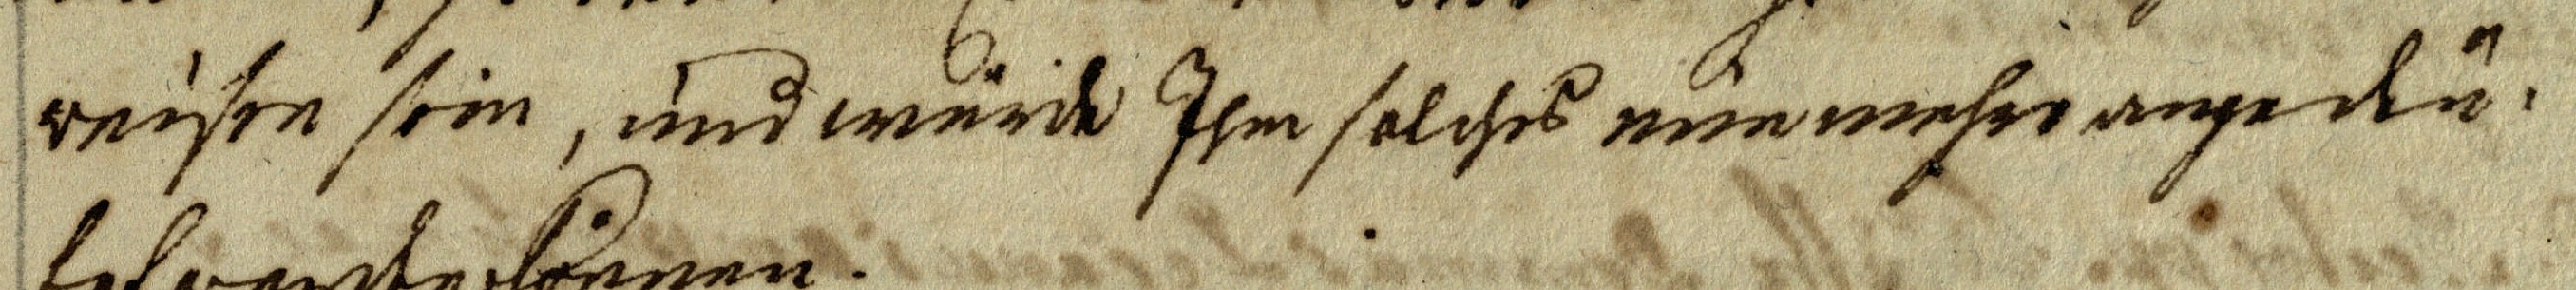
tet werden können.
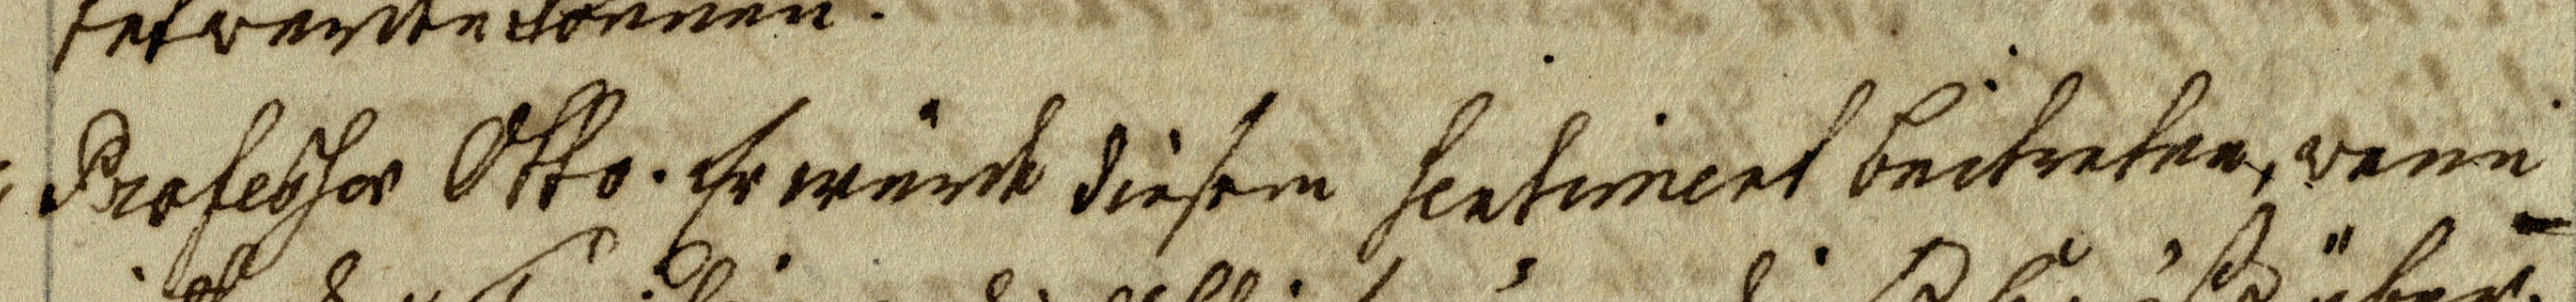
dh Professor Otto. Er würde diesem sentiment beitreten, wenn
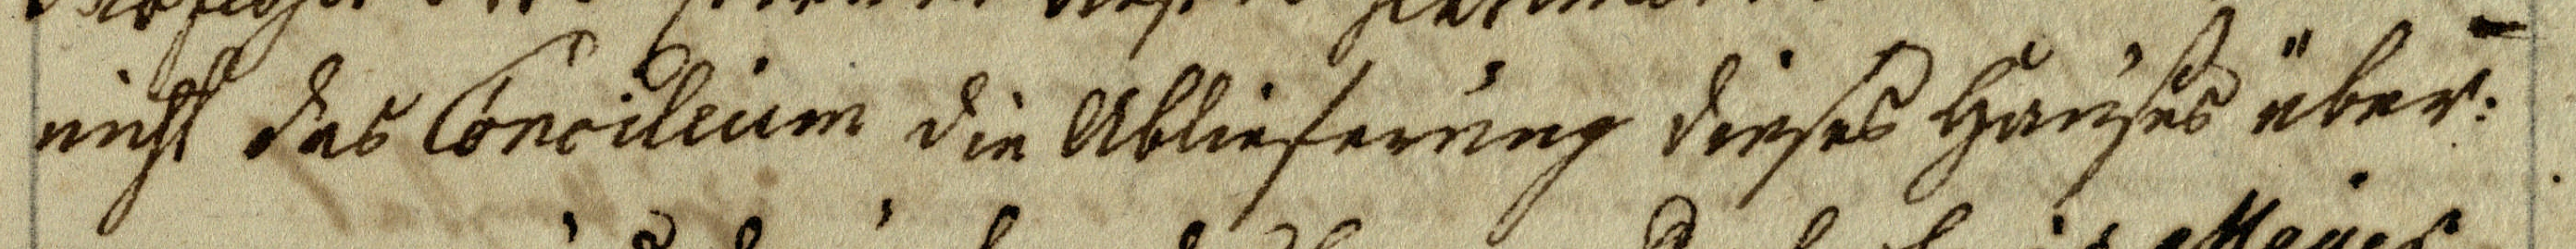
nicht das Concilium die Ablieferung dieses Haußes über¬
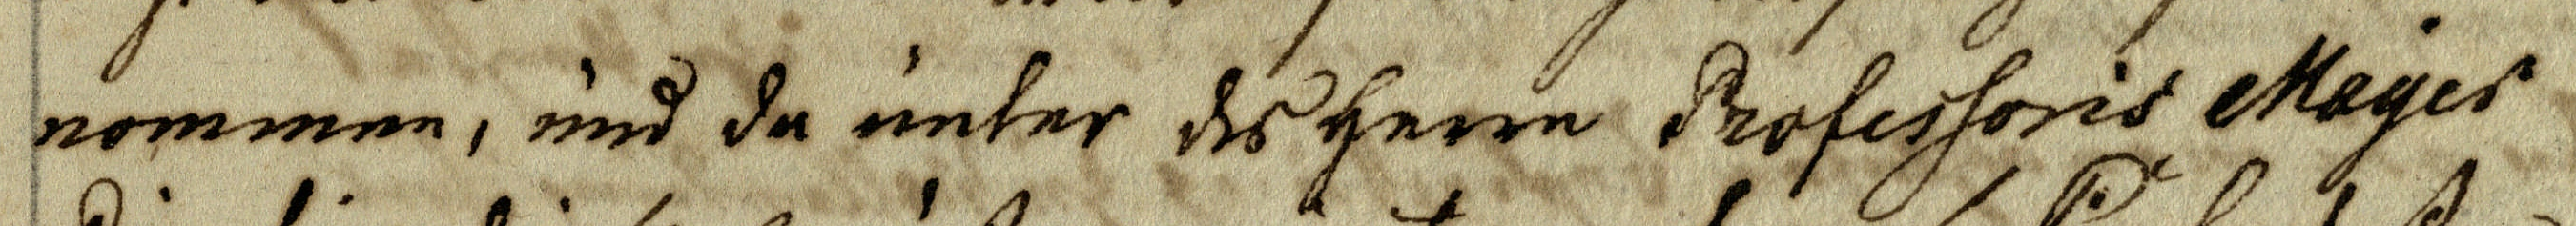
nommen, und da unter des Herrn Professoris Maÿer
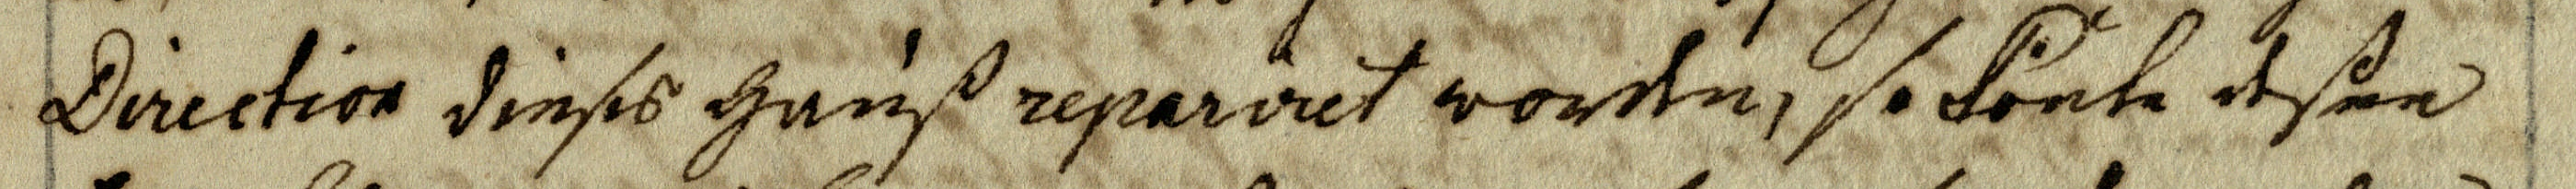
Direction dieses Hauß repariret worden, so könte deßen
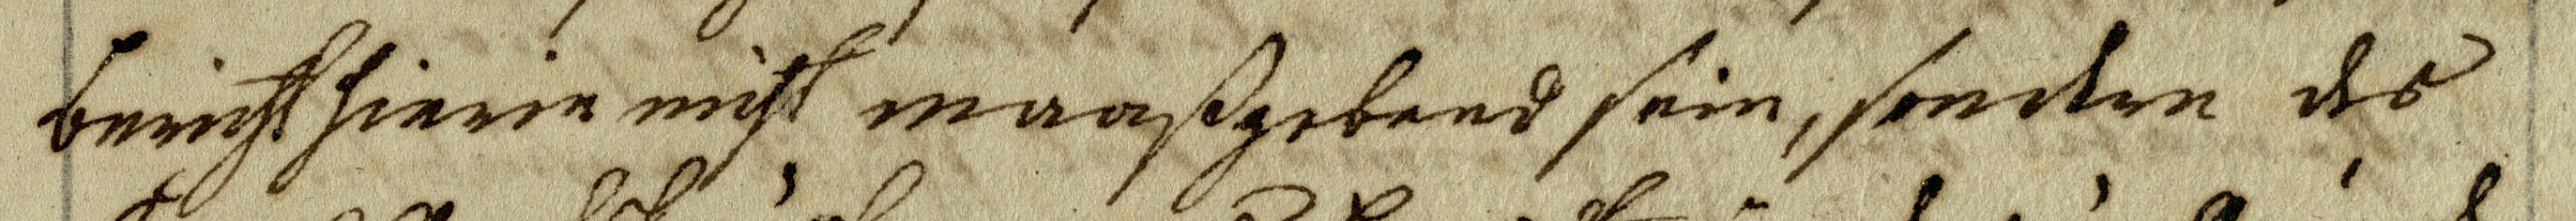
Bericht hierin nicht maaßgebend sein, sondern des
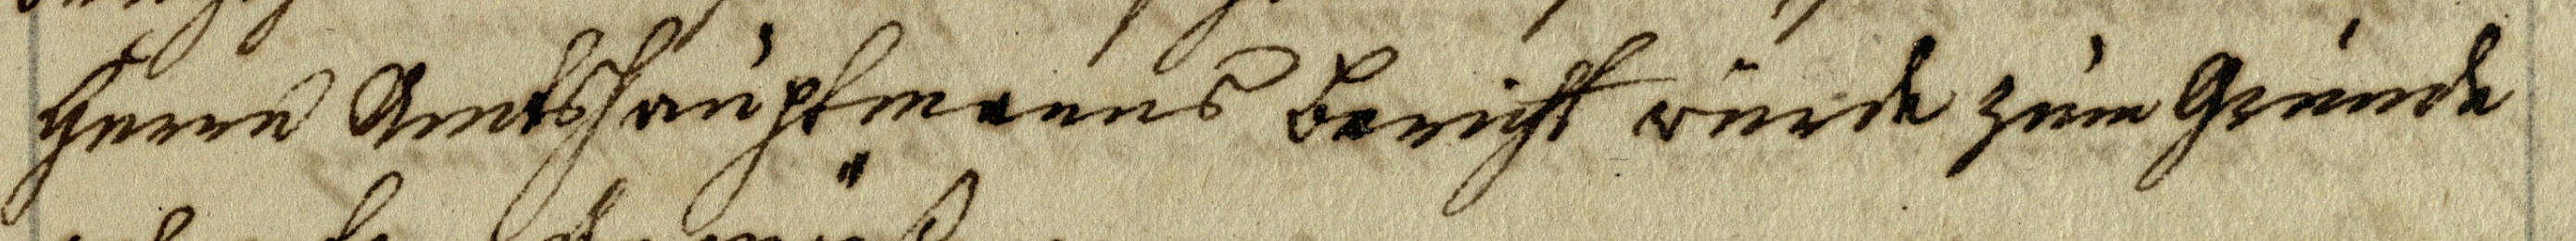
Herrn Amtshauptmanns Bericht würde zum Grunde
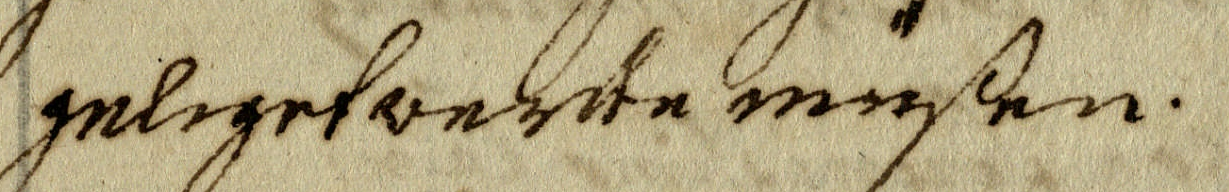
geleget werden müßen.
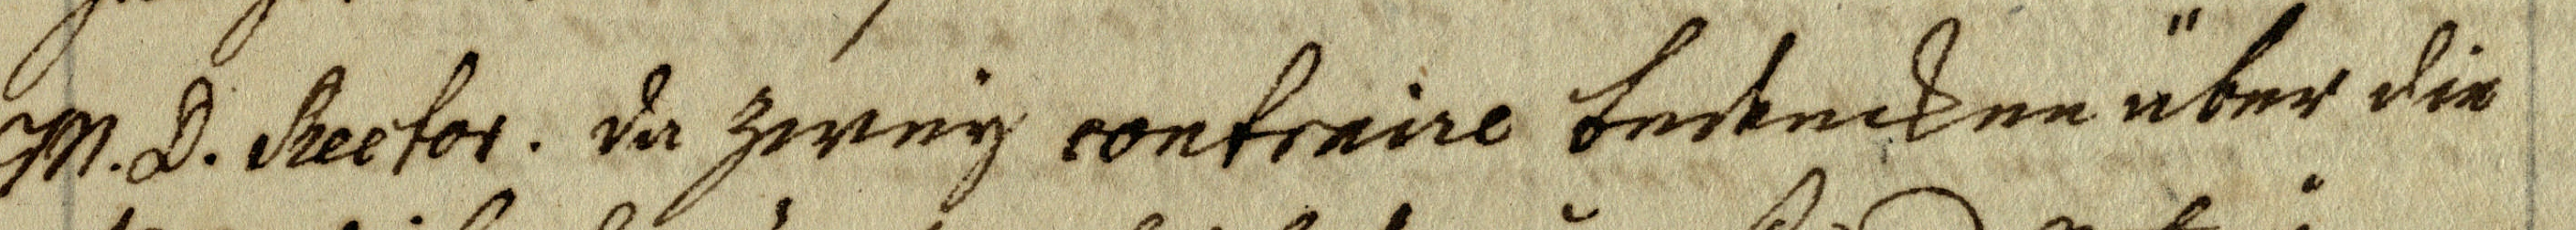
M. D. Rector. Da zweÿ contraire Bedenken über die
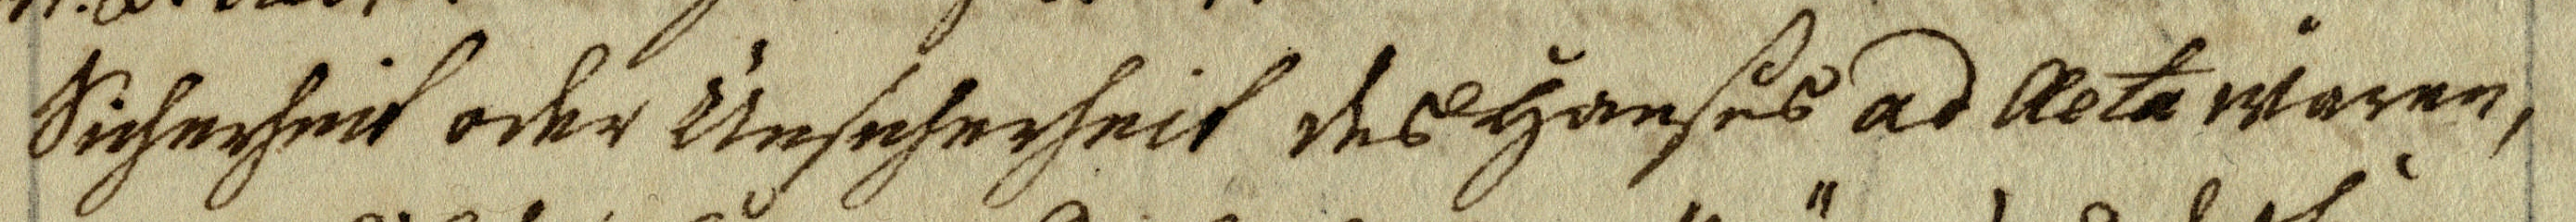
Sicherheit oder Unsicherheit des Haußes ad Acta wären,
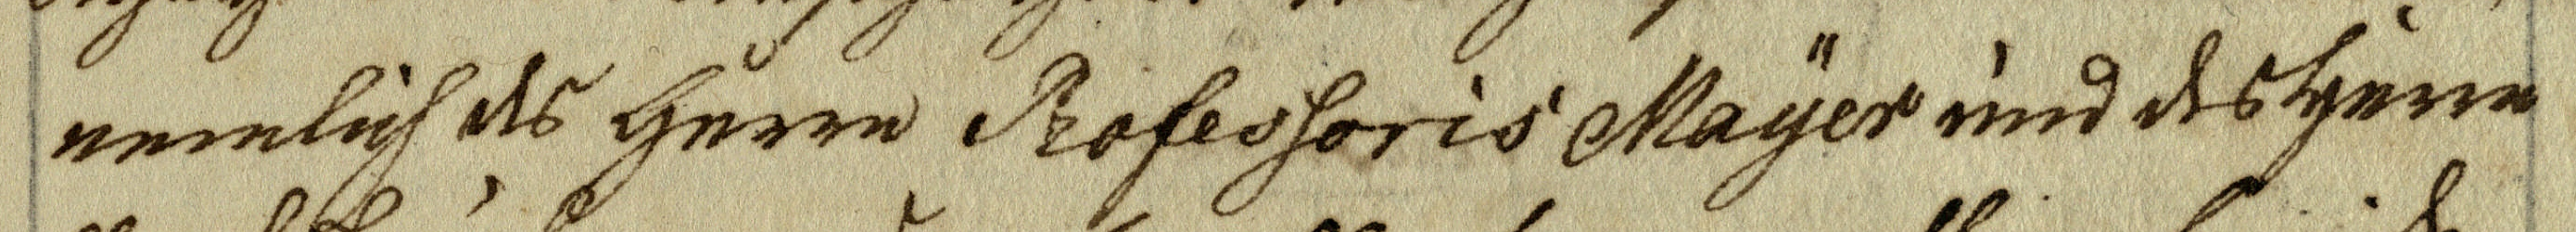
nemlich des Herrn Profesoris Maÿer und des Herrn
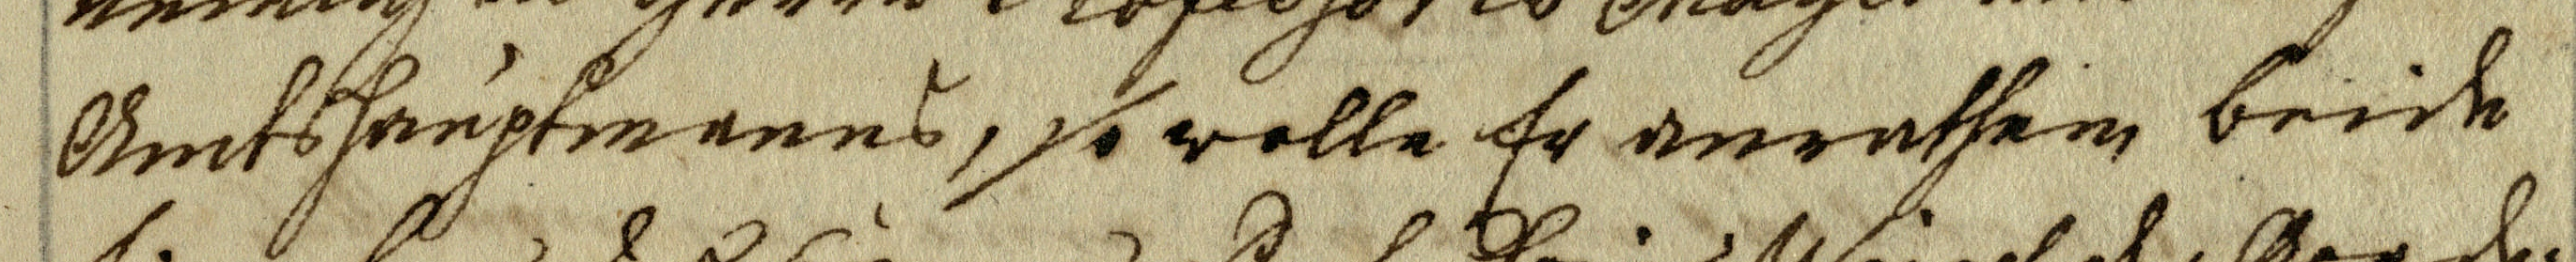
Amtshauptmanns, so wolle Er anrathen, beide
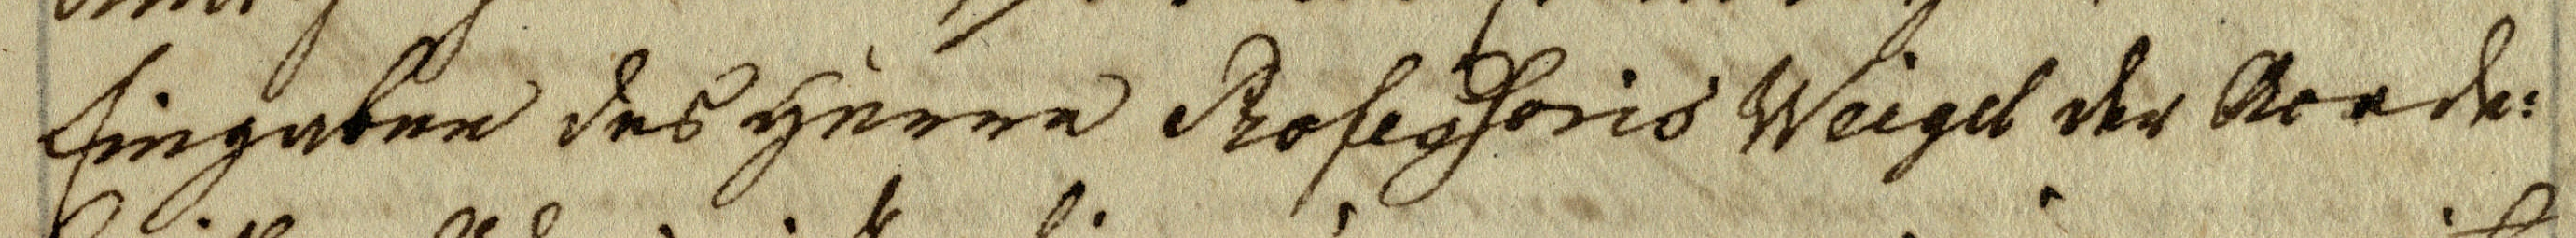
Eingaben des Herrn Professoris Weigel der Acade¬
